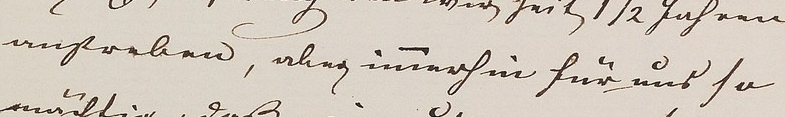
anstreben, aber immerhin für uns so
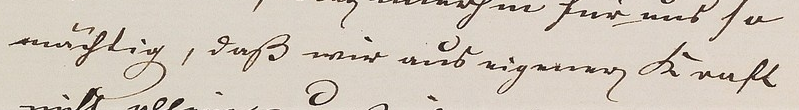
mächtig, daß wir aus eigener Kraft
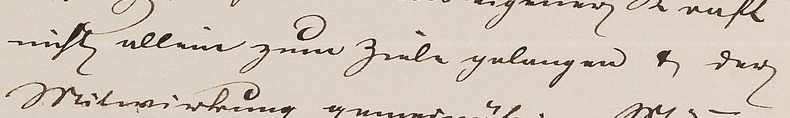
nicht alleine zum Ziele gelangen & der
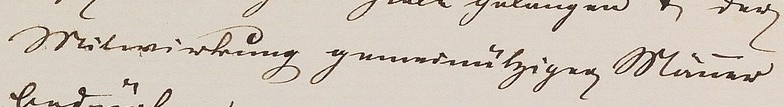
Mitwirkung gemeinütziger Männer
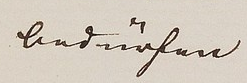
bedürfen.
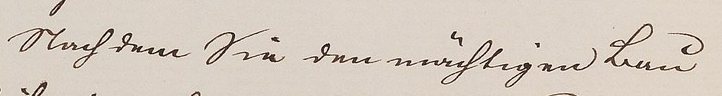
Nachdem Sie den mächtigen Bau
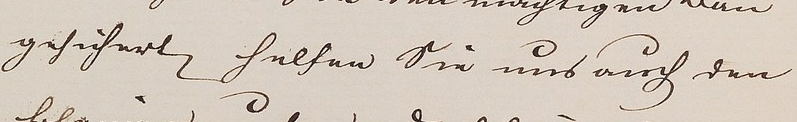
gesichert, helfen Sie uns auch den
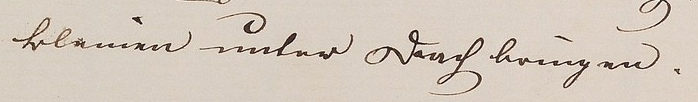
kleinen unter Dach bringen.
